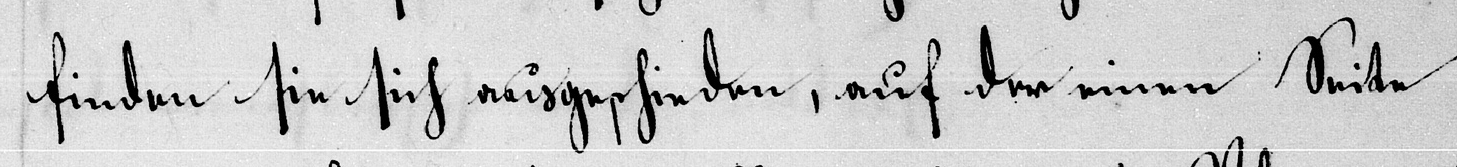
finden sie sich ausgeschieden, auf der einen Seite
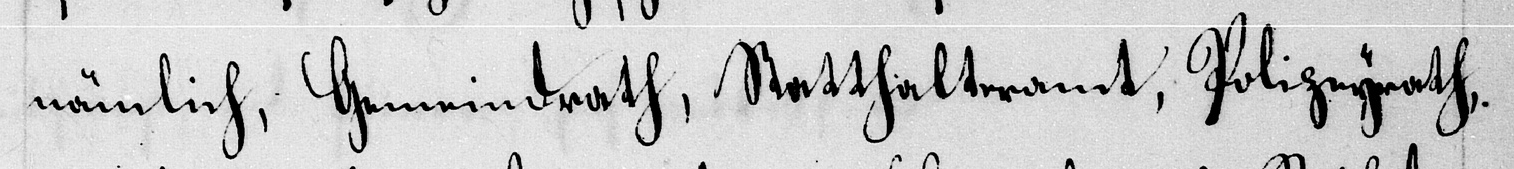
nämlich, Gemeindrath, Statthalteramt, Polizeyrath,
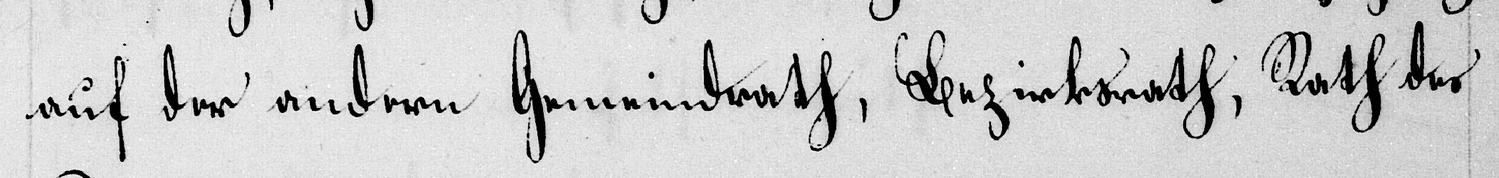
auf der andern Gemeindrath, Bezirksrath, Rath des
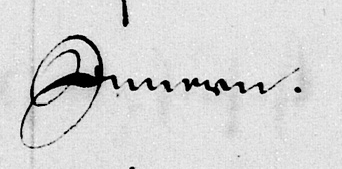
Innern.
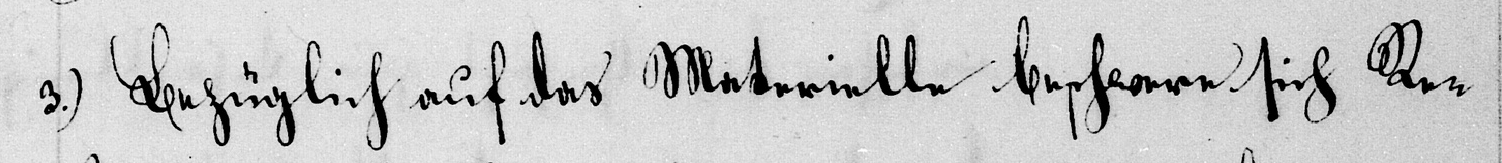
3.) Bezüglich auf das Materielle beschwere sich Re¬
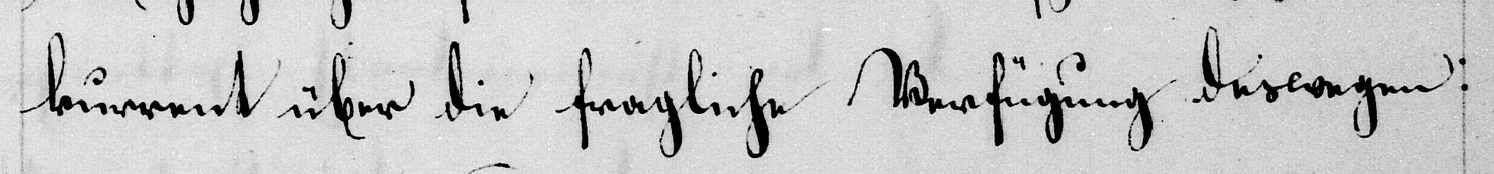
kurrent über die fragliche Verfügung deswegen:
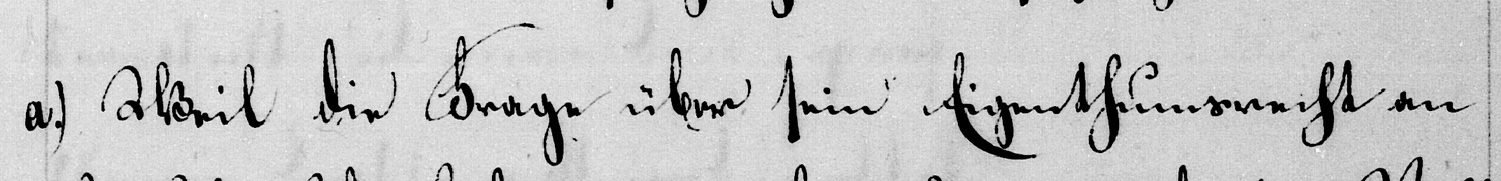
a.) Weil die Frage über sein Eigenthumsrecht an
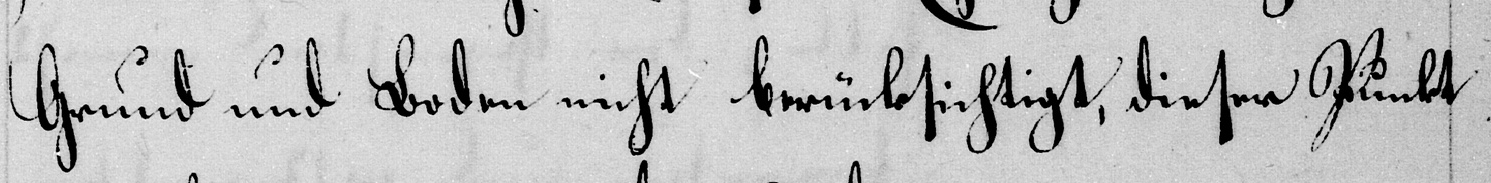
Grund und Boden nicht berücksichtigt, dieser Punkt
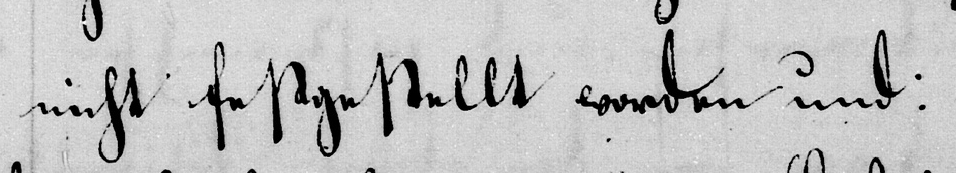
nicht festgestellt worden und:
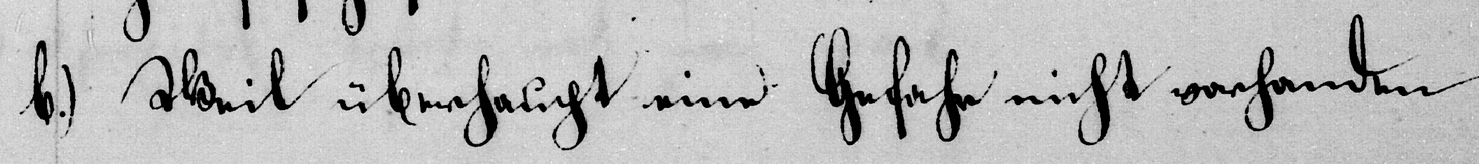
b.) Weil überhaupt eine Gefahr nicht vorhanden
